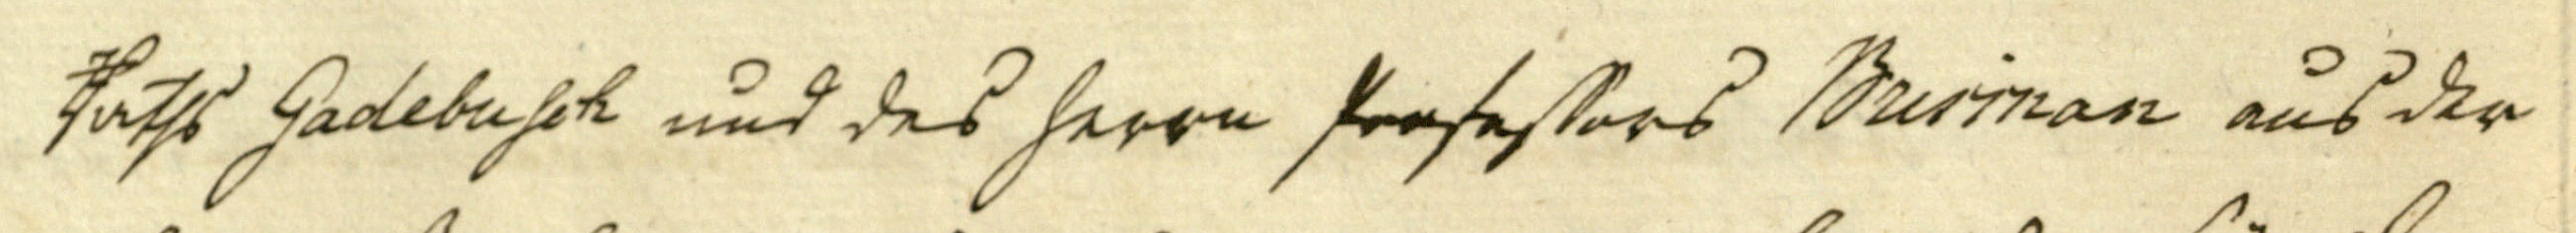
Raths Gadebusch und des Herrn Professors Brisman aus der
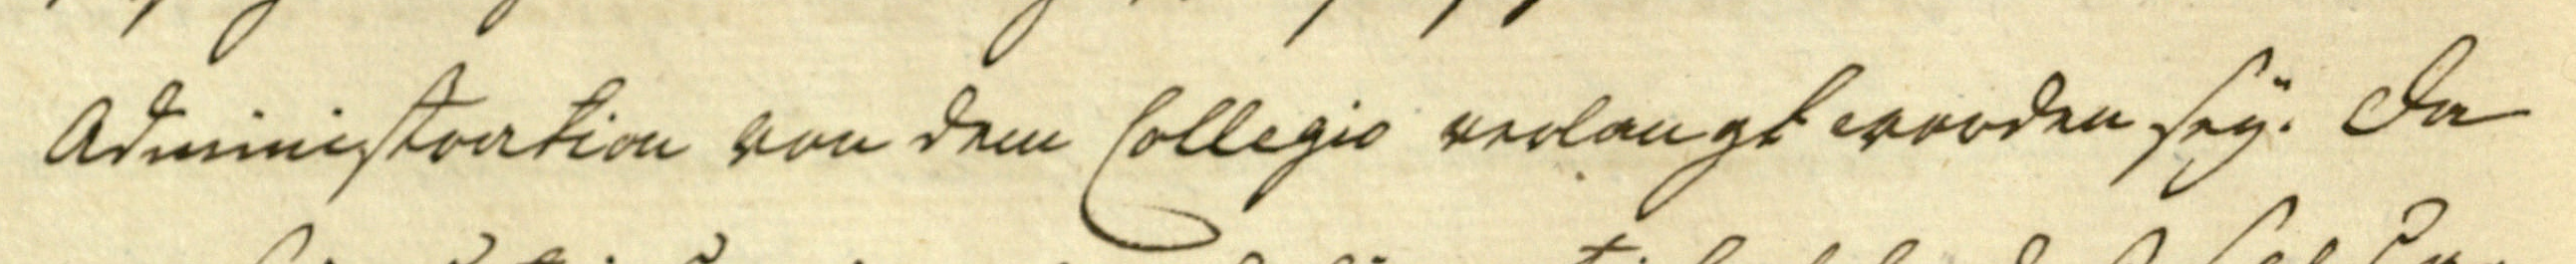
Administration von dem Collegio verlangt worden seÿ. Da
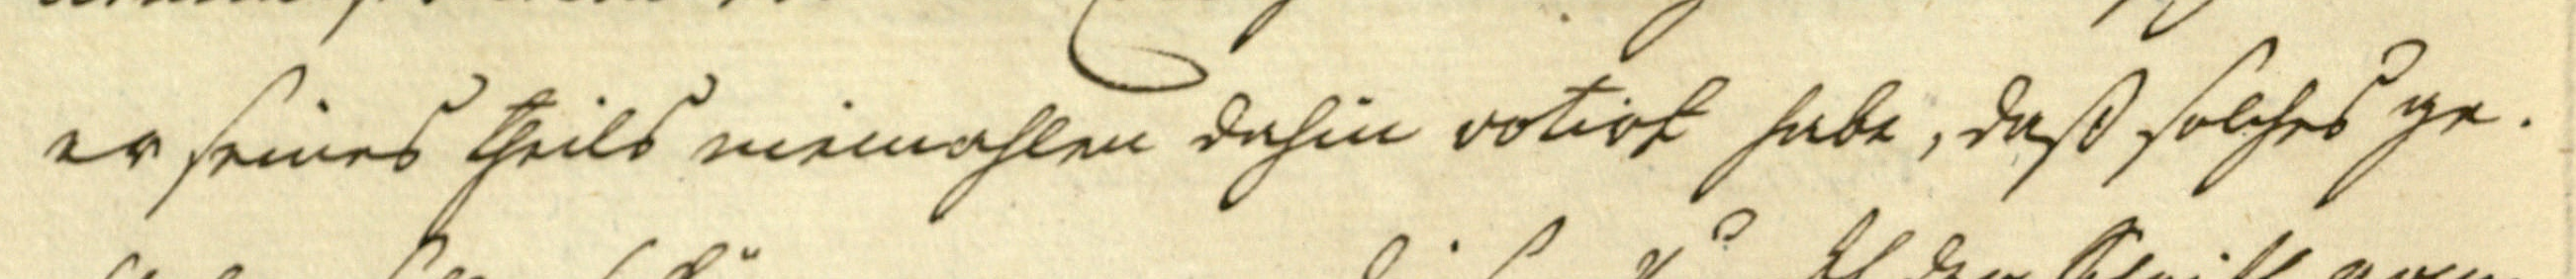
er seines theils niemahlen dahin votirt habe, daß solches ge¬
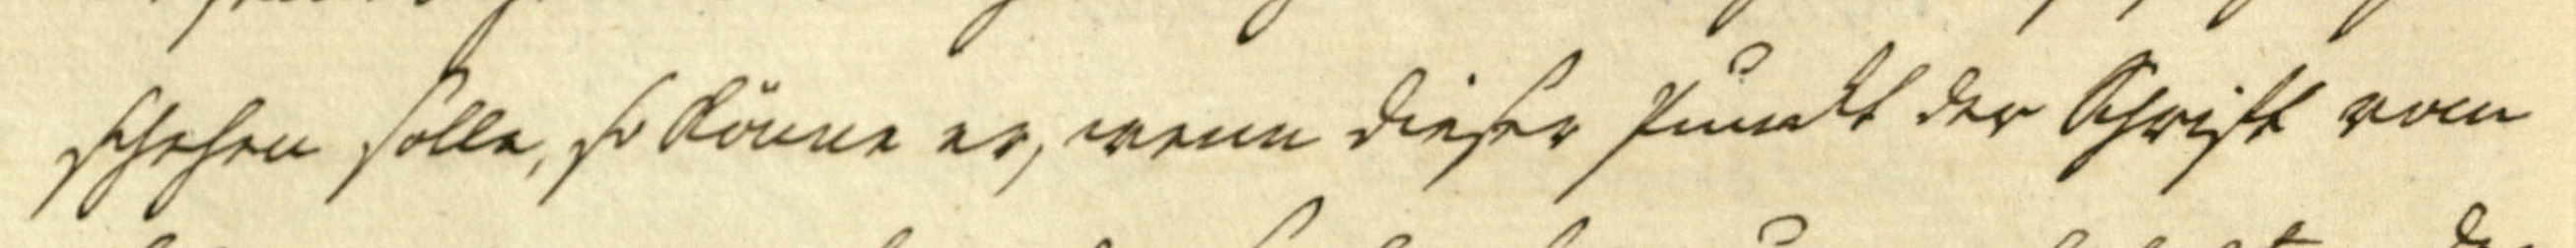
schehen solle, so könne er, wenn dieser Punckt der Schrift vom
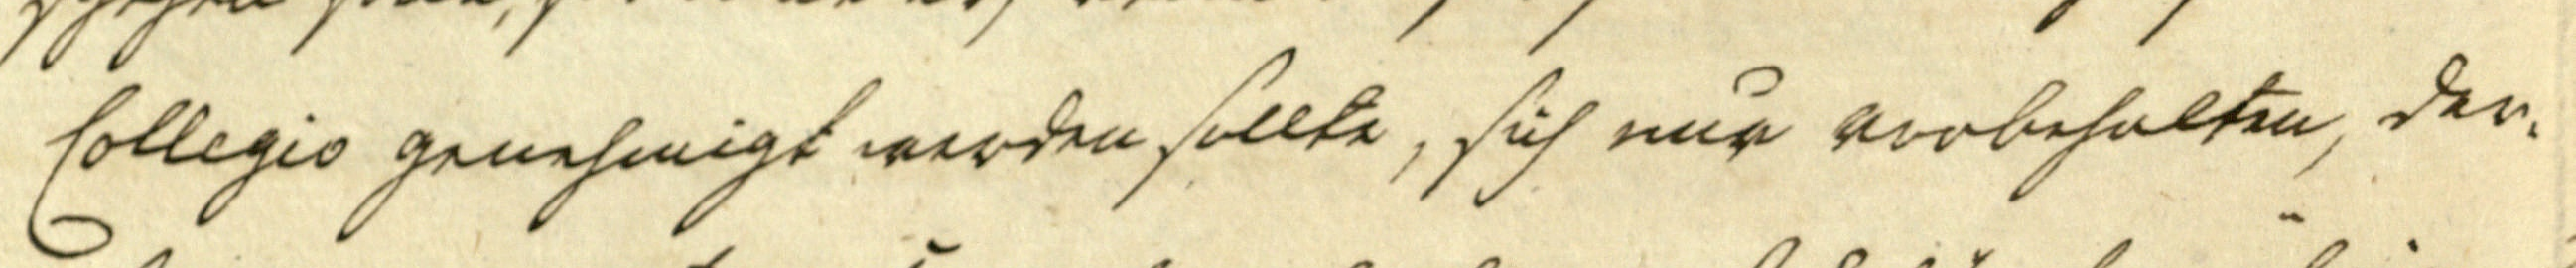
Collegio genehmigt werden sollte, sich nur vorbehalten, der¬
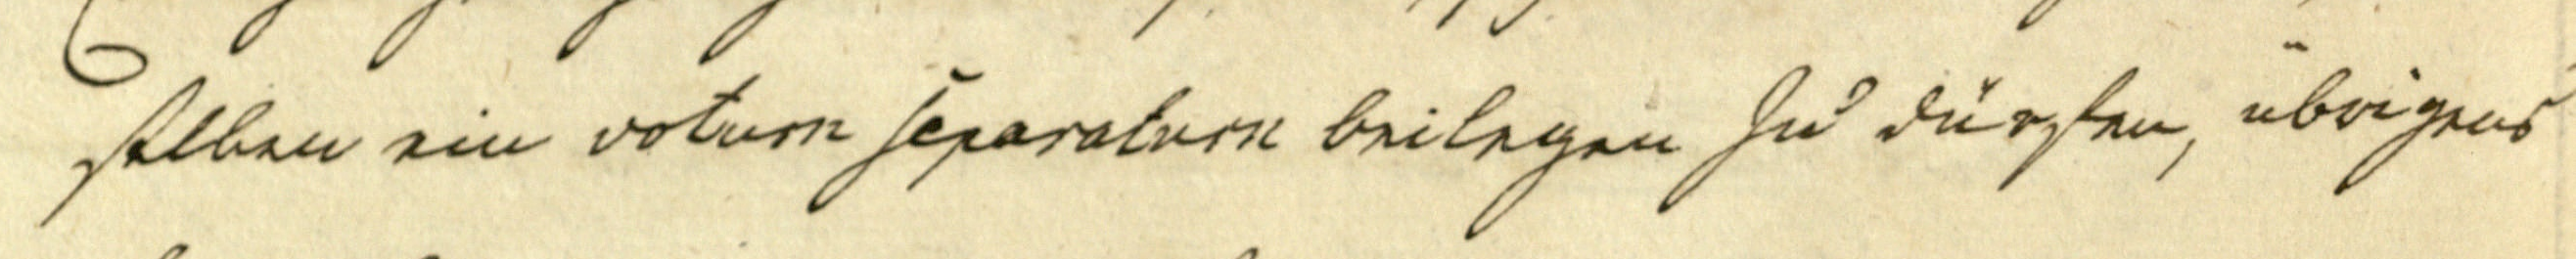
selben ein votum separatum beilegen zu dürfen, übrigens
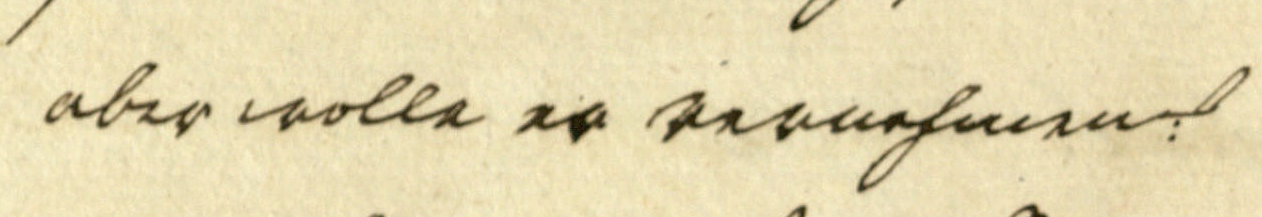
aber wolle er vernehmen:
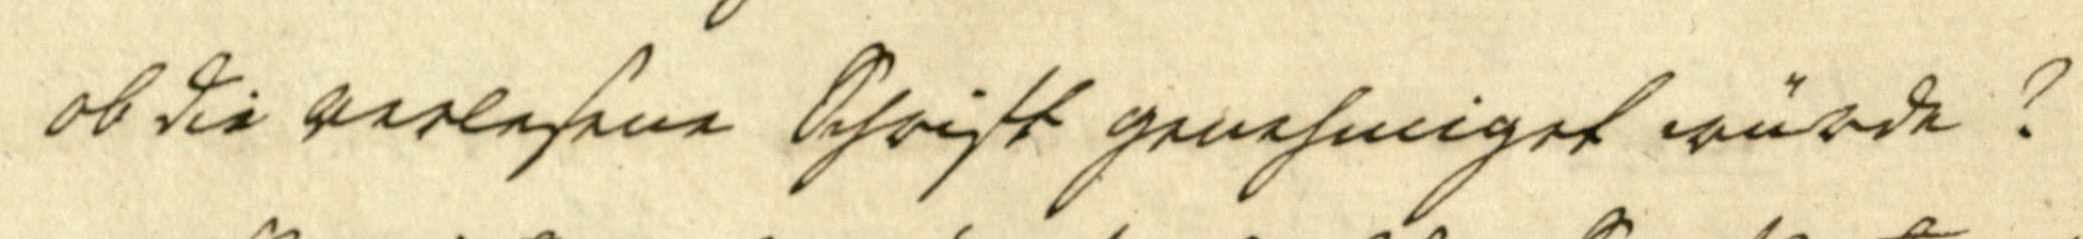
ob die verlesene Schrift genehmiget würde?
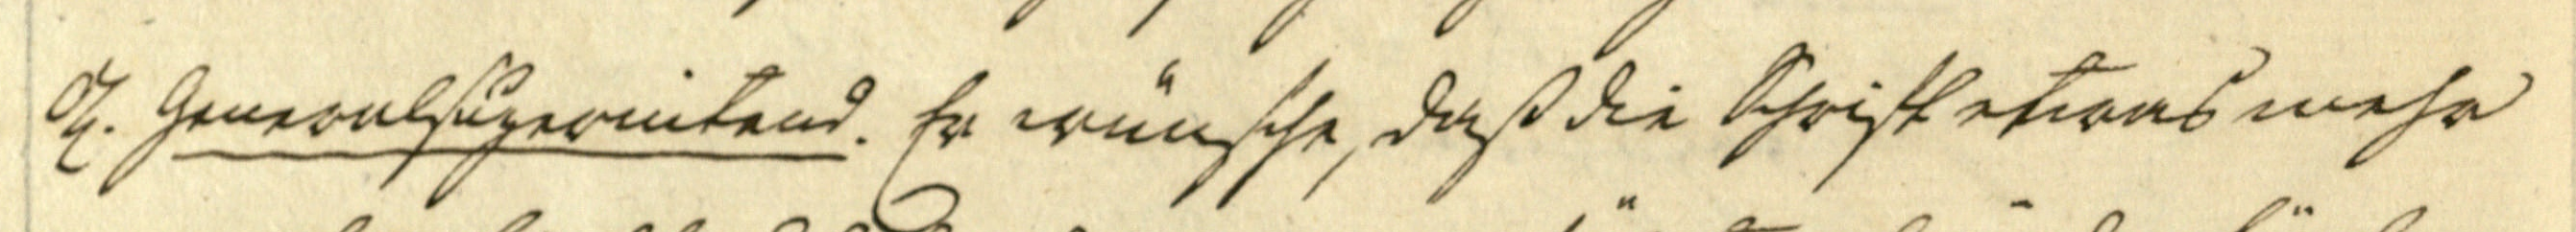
dh. Generalsuperintend. Er wünsche, daß die Schrift etwas mehr
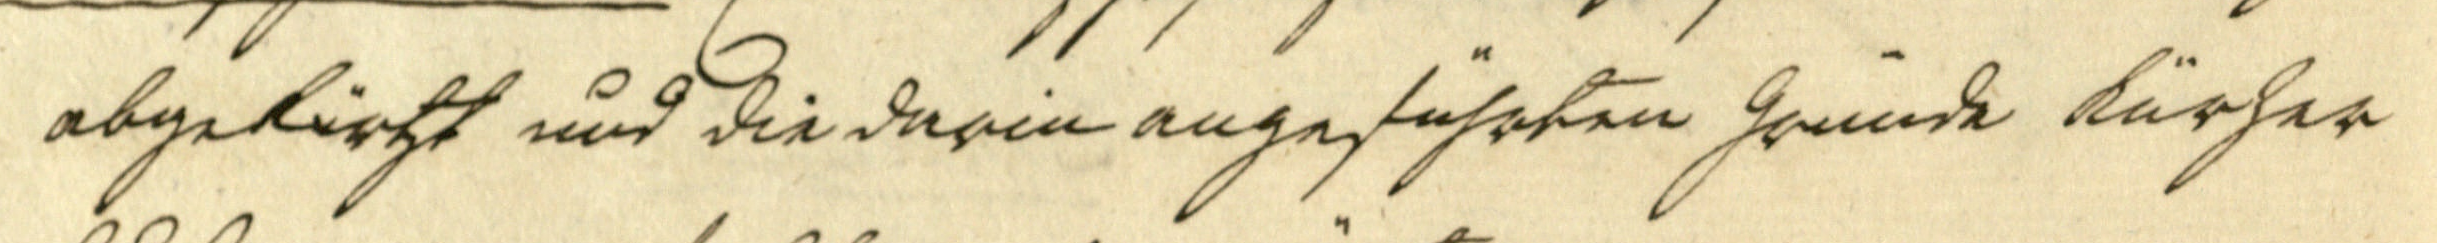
abgekürtzt und die darin angeführten Gründe kürzer
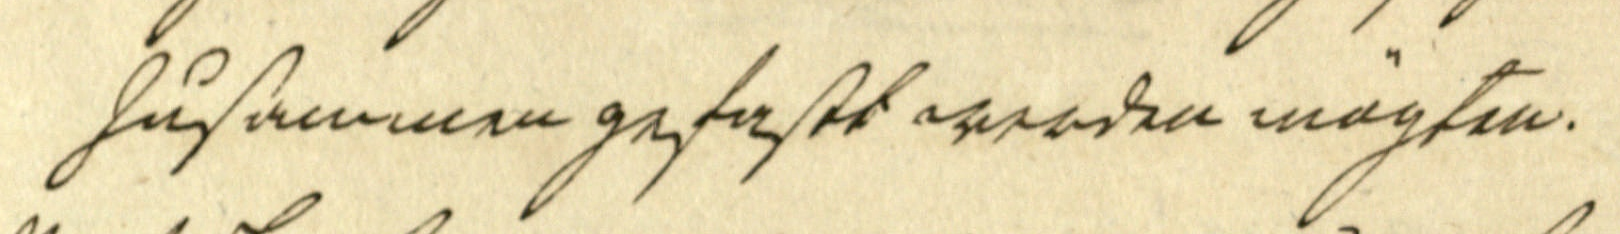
zusammen gefaßt werden mögten.
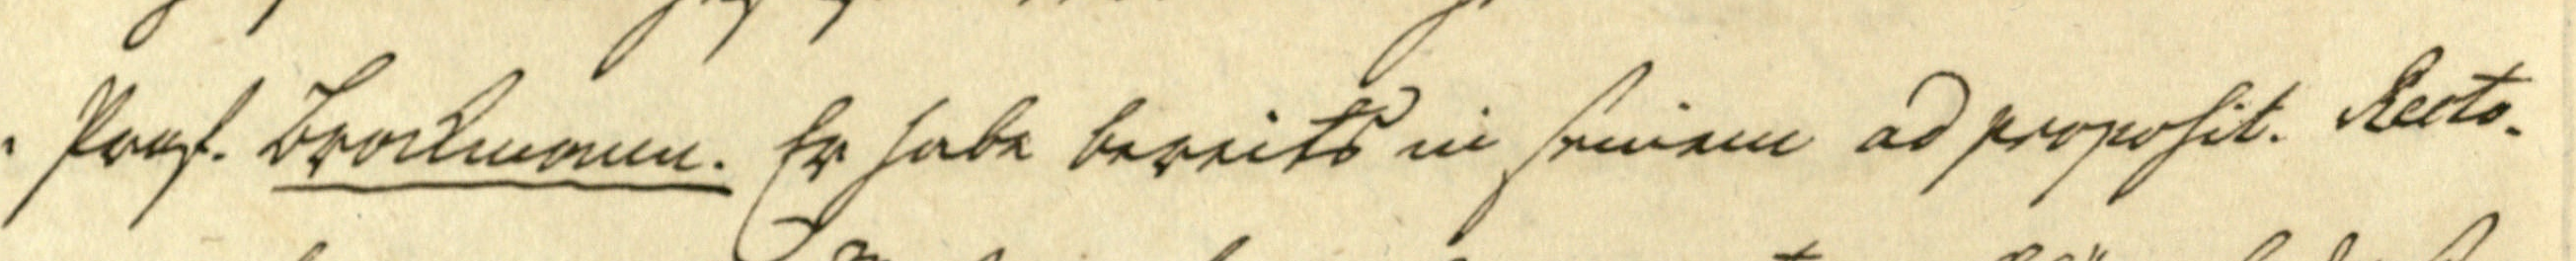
Prof. Brockmann. Er habe bereits in seinem ad proposit. Recto¬
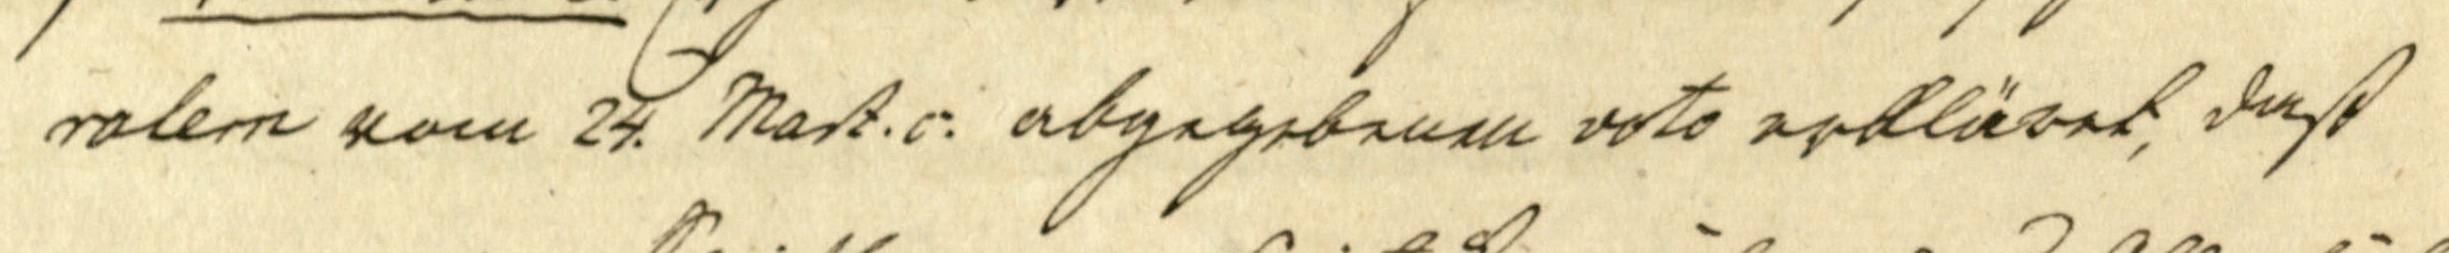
ralem vom 24. Mart c. abgegebenen voto erkläret, daß
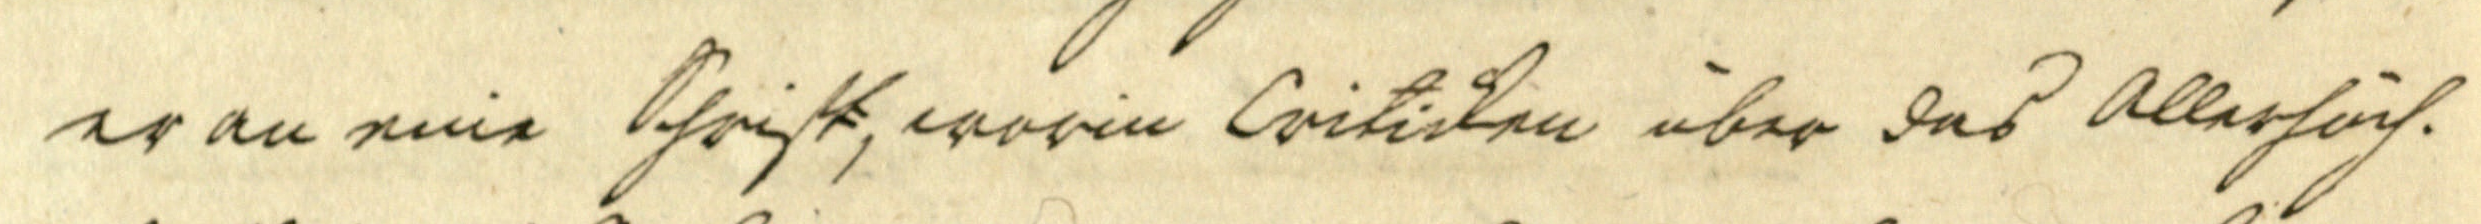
er an eine Schrift, worin Criticken über das Allerhöch¬
